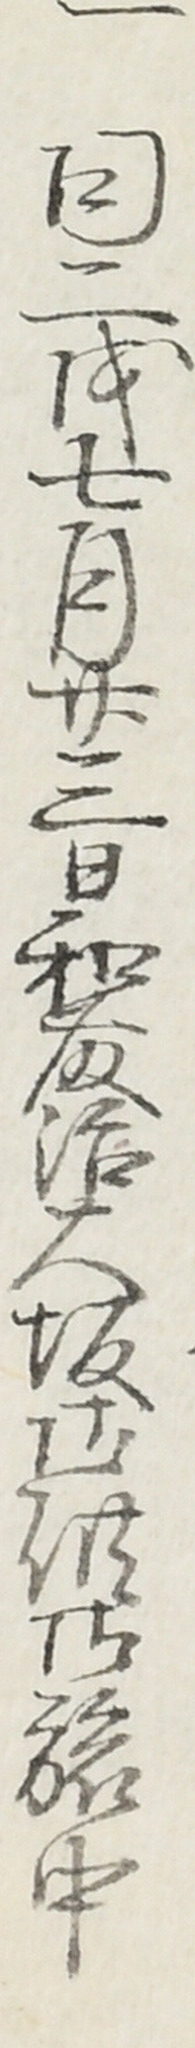一同二戌七月廿三日和藤治大坂御供御旅中
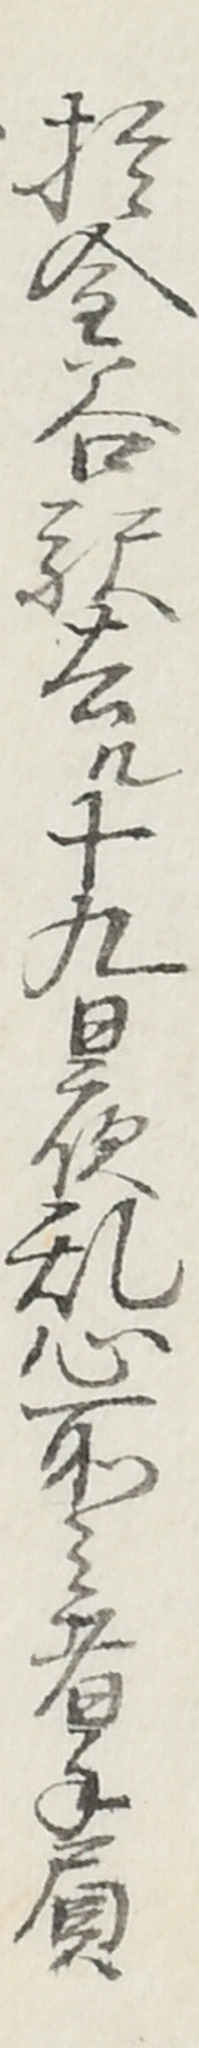於金谷駅去ル十九日夜乱心所之者手負
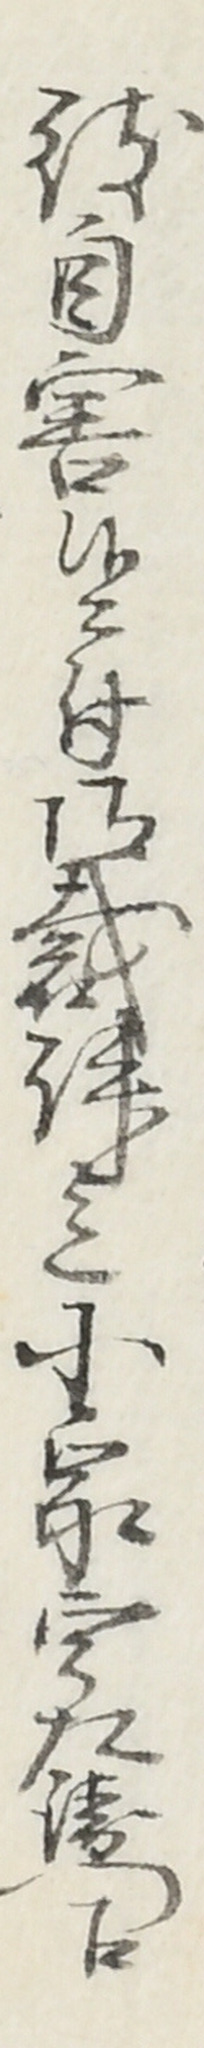致自害候ニ付御裁拝迄小泉宇左衛門江
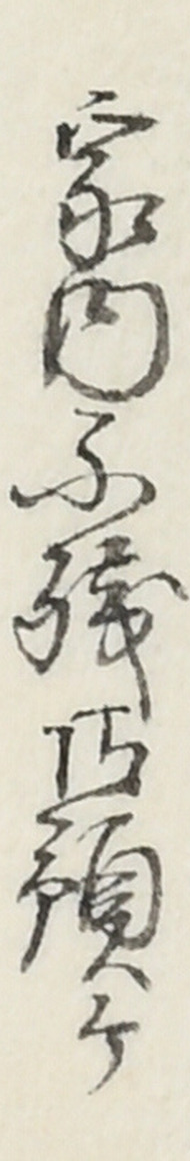家内不残御預ヶ

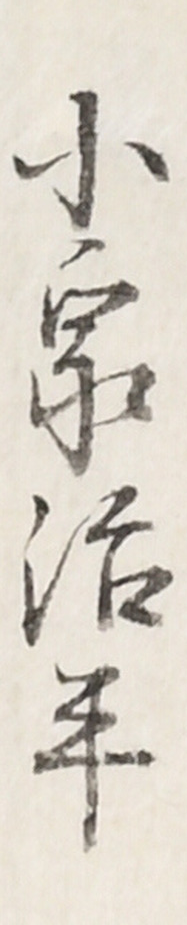小泉治平
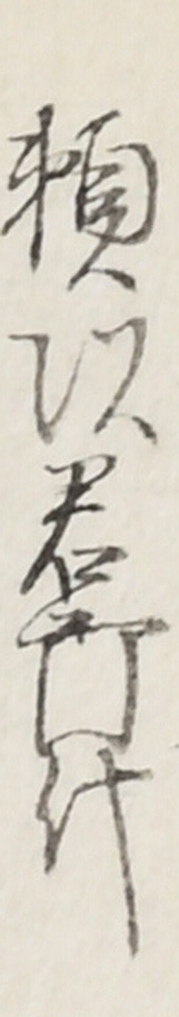頼以君御代
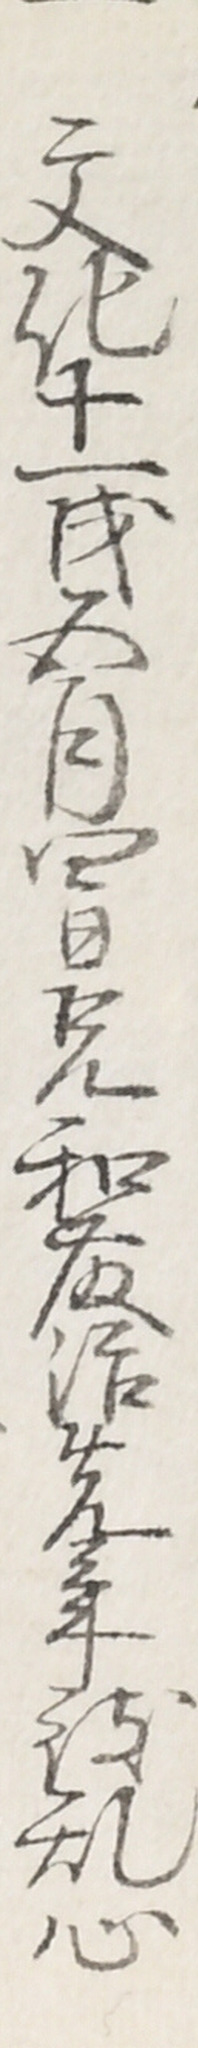一文化十一戌五月四日兄和藤治先年致乱心
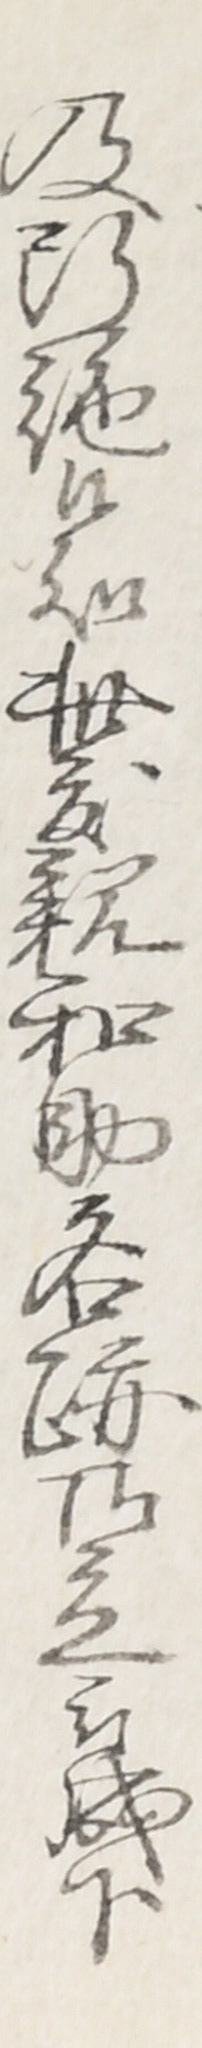及断絶候処此度親和助名跡御立被成下
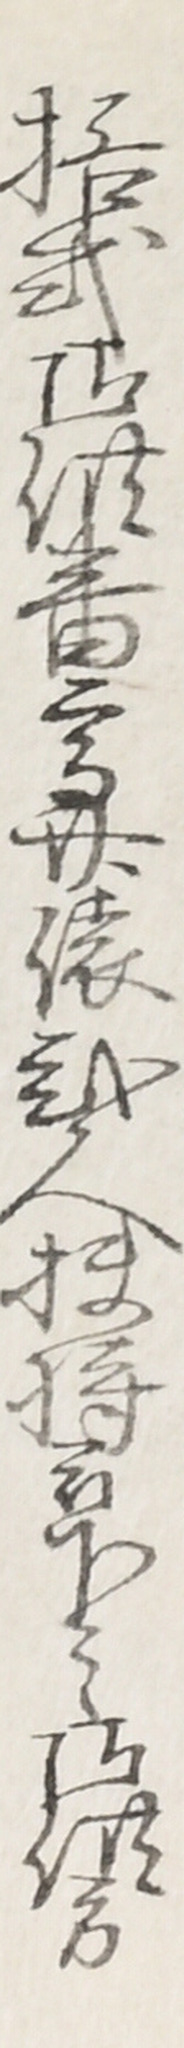格式御供番高廿俵弐人扶持被下之御供方
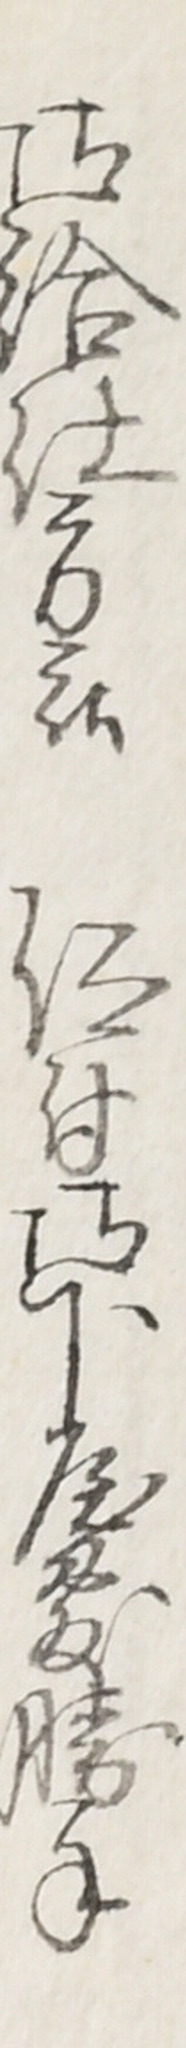御給仕方被仰付御下屋敷勝手
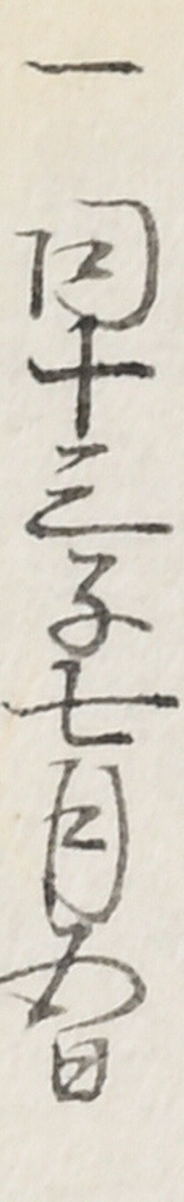一同十三子七月五日
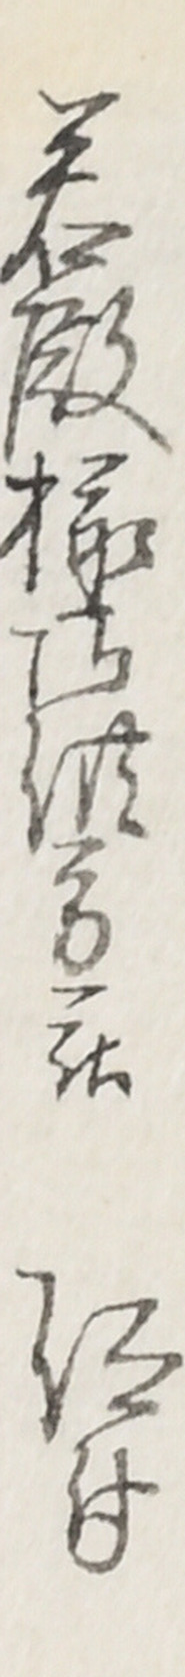若殿様御供方被仰付
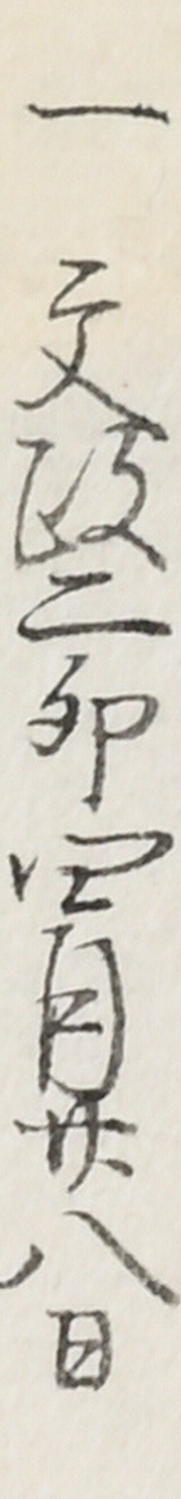一文政二卯四月廿八日
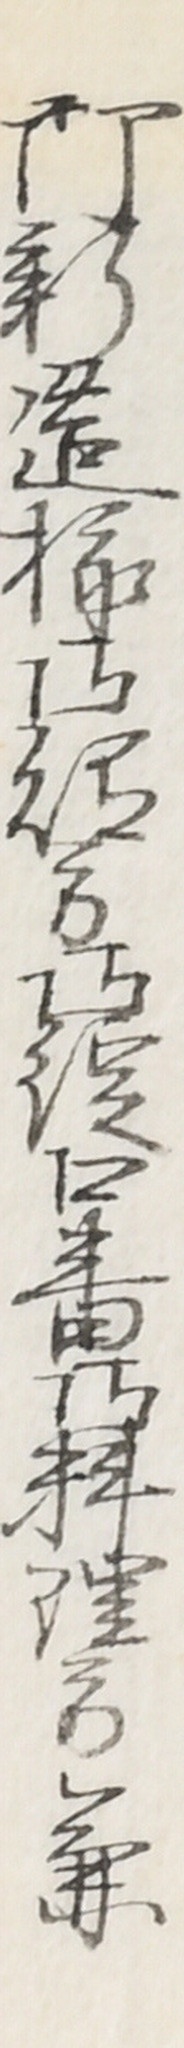御新造様御賄方御錠口番御料理方兼
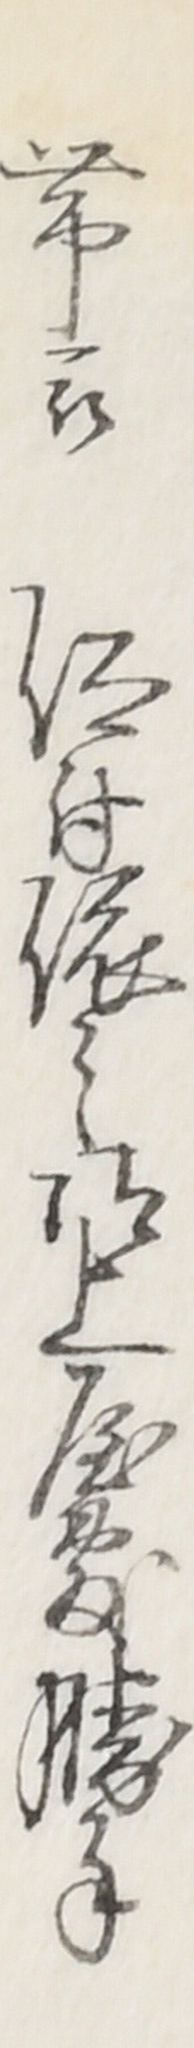帯被仰付依之御上屋敷勝手
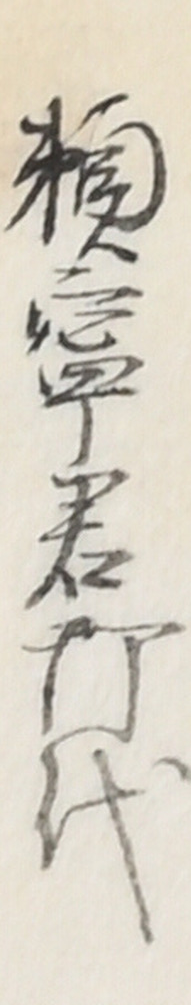頼寧君御代
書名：給人諸士勤仕録（七）
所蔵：伊那市立高遠町図書館・合同会社AMANE
